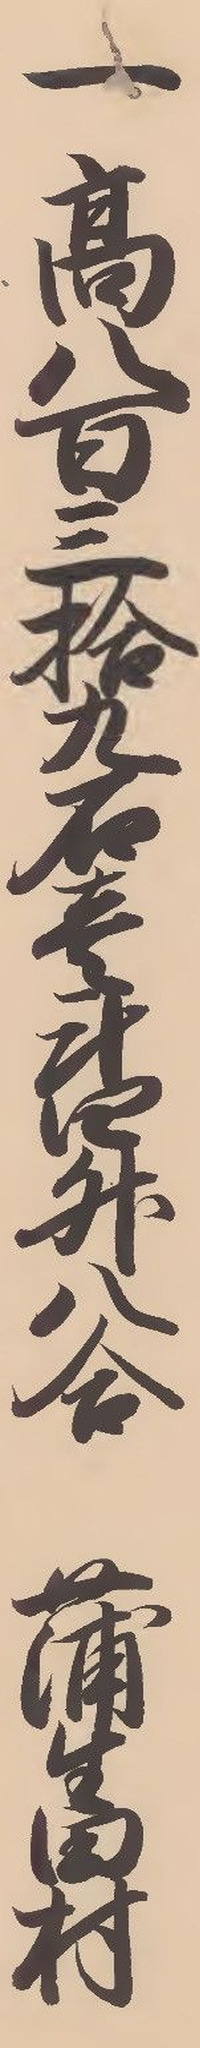一高八百三拾九石壱斗四升八合蒲生田村
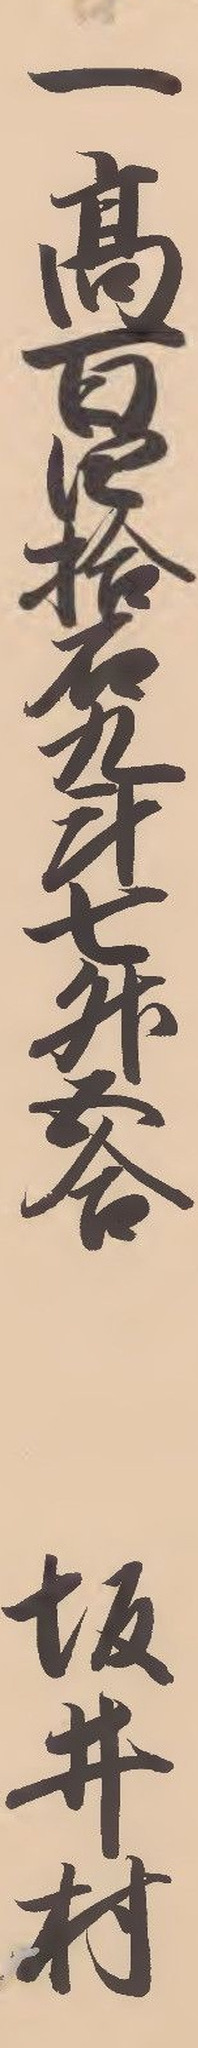一高百四拾石九斗七升五合坂井村
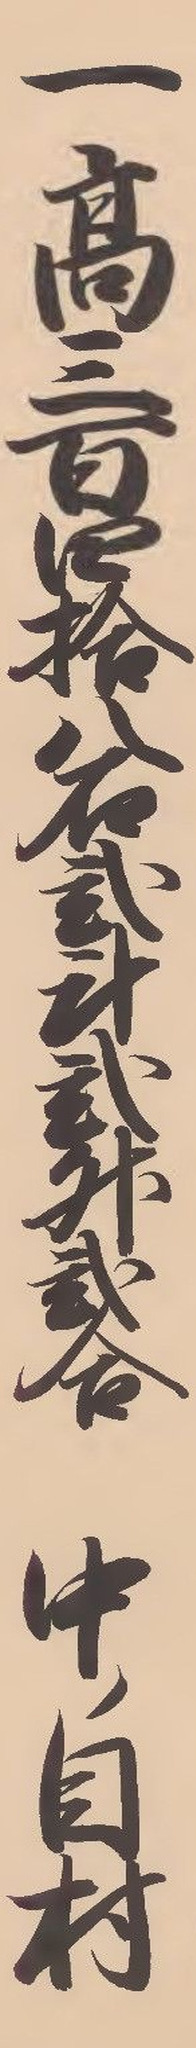一高三百四拾八石弐斗弐升弐合中ノ目村
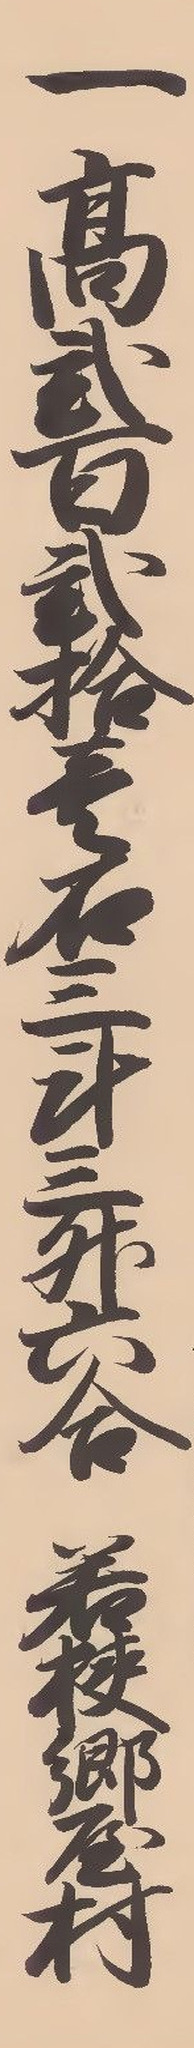一高弐百弐拾壱石三斗三升六合若狭郷屋村
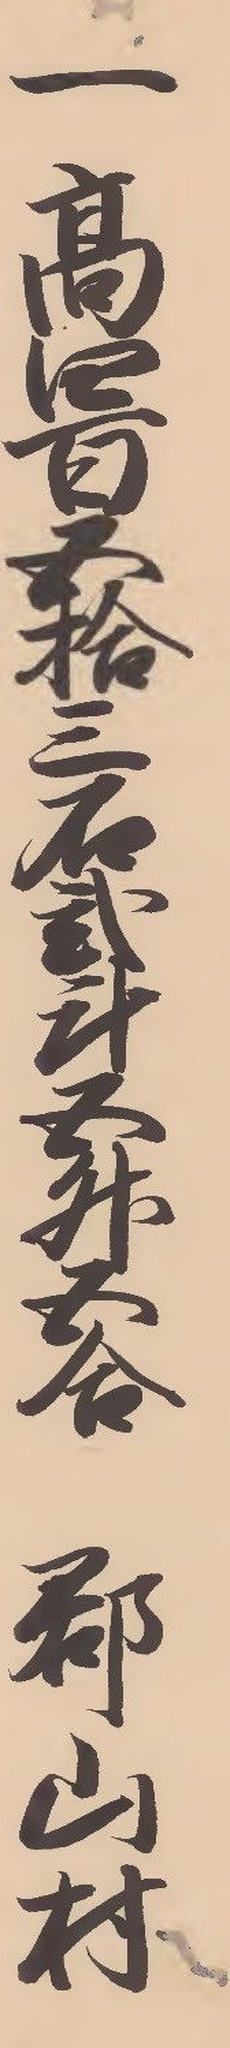一高四百五拾三石弐斗五升五合郡山村
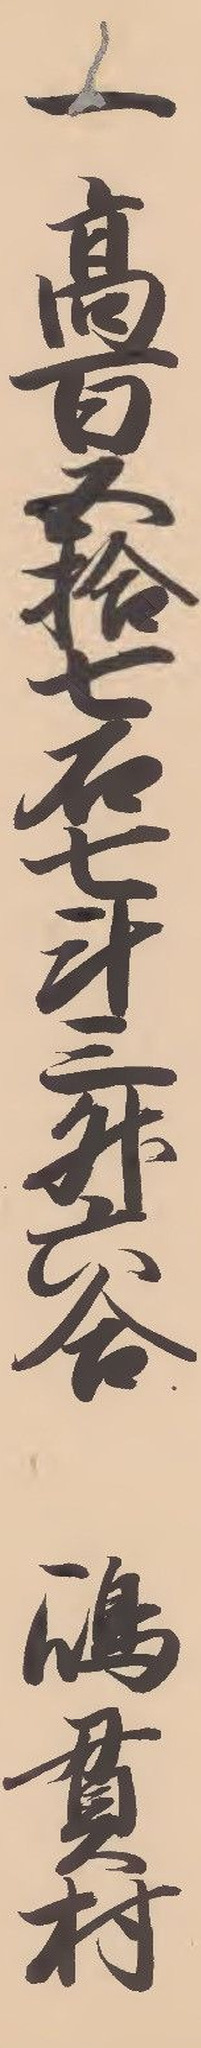一高百五拾七石七斗三升六合島貫村
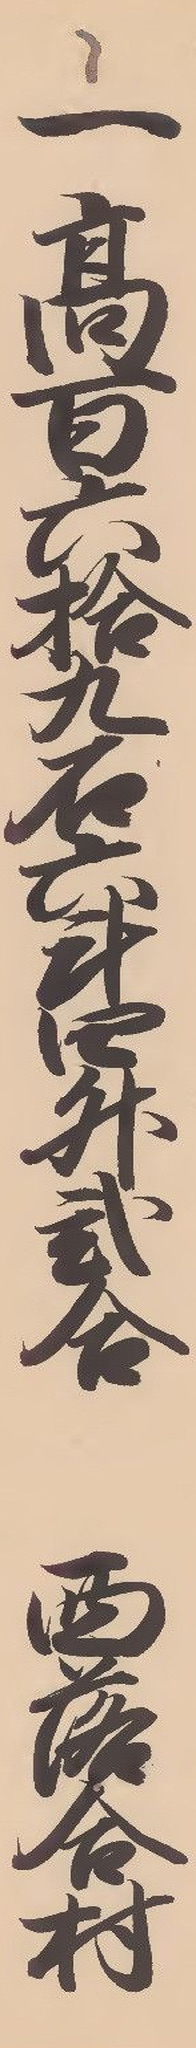一高百六拾九石六斗四升弐合西落合村

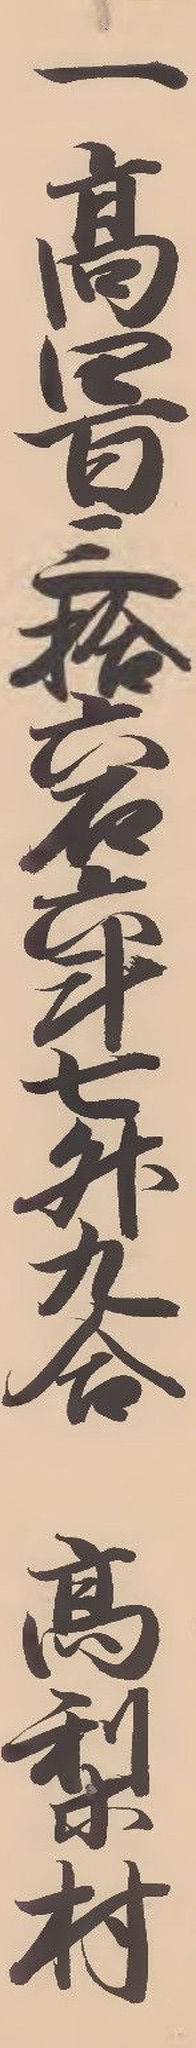一高四百三拾六石六斗七升九合高梨村
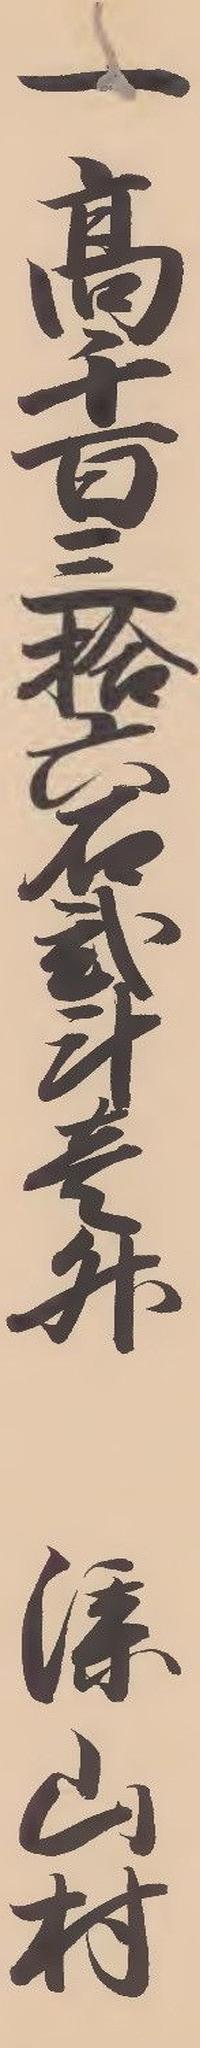一高千百三拾六石弐斗壱升漆山村
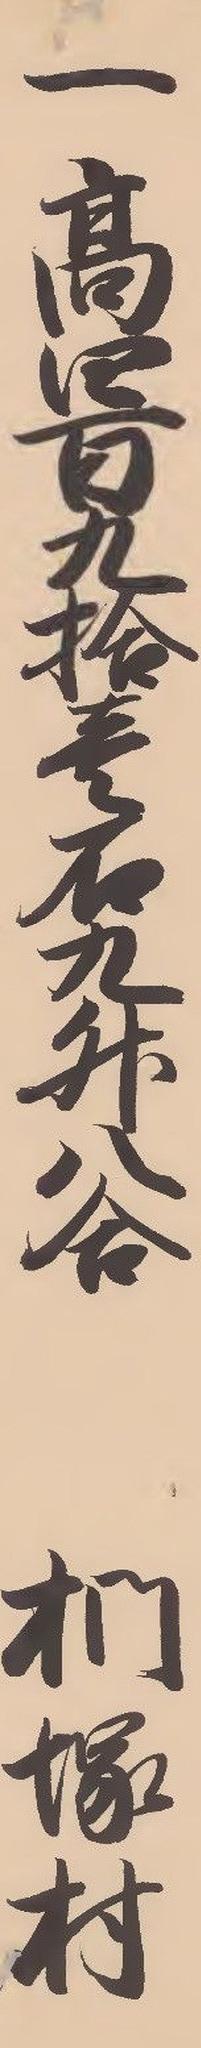一高四百九拾壱石九升八合椚塚村
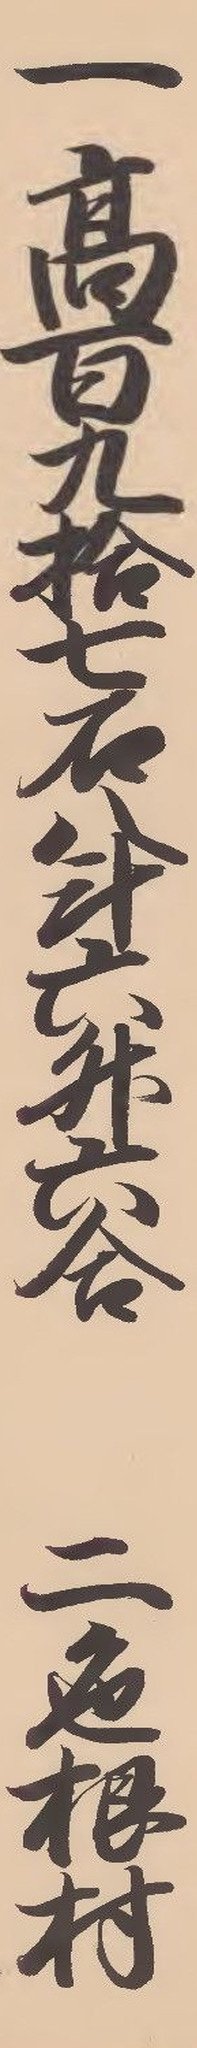一高百九拾七石八斗六升六合二色根村
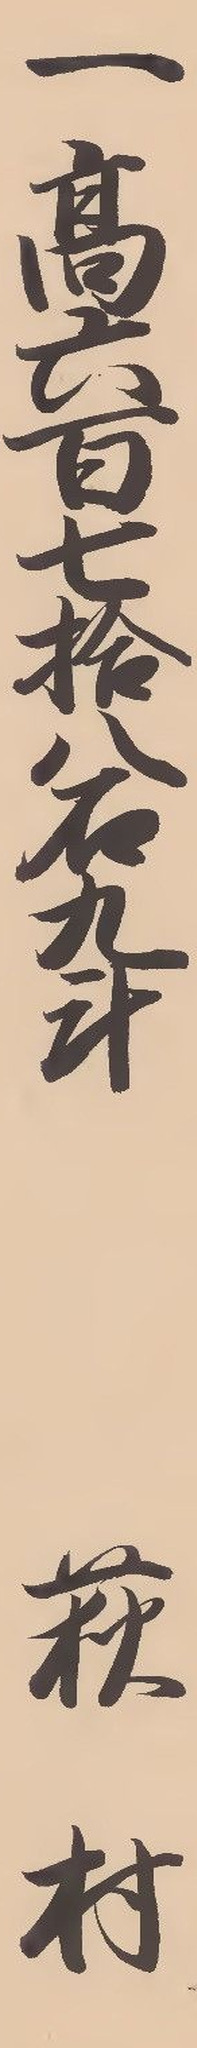一高六百七拾八石九斗萩村
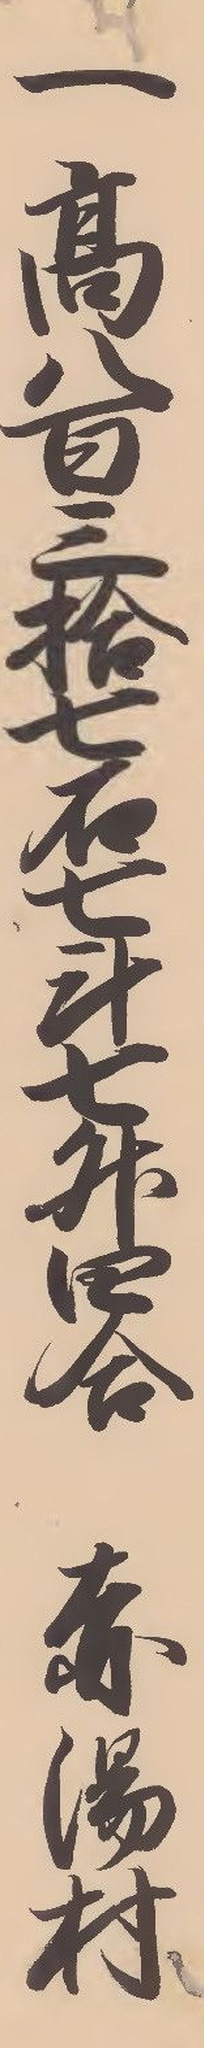一高八百三拾七石七斗七升四合赤湯村
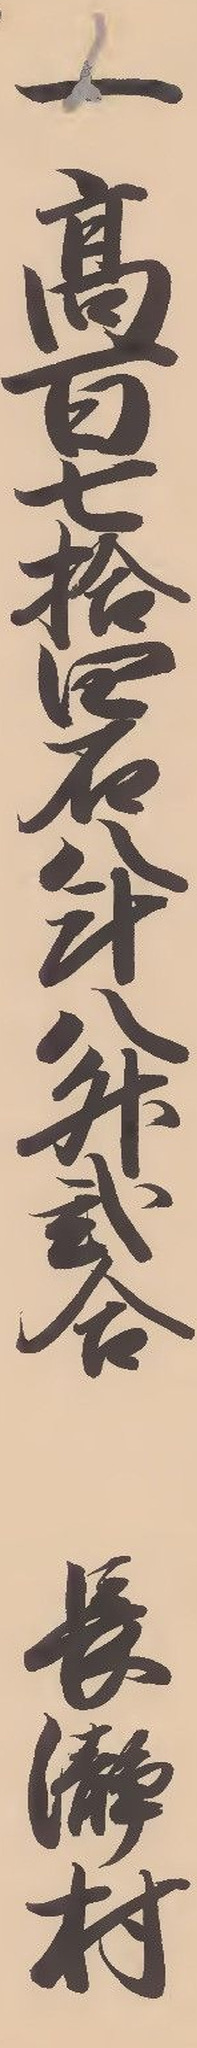一高百七拾四石八斗八升弐合長瀞村
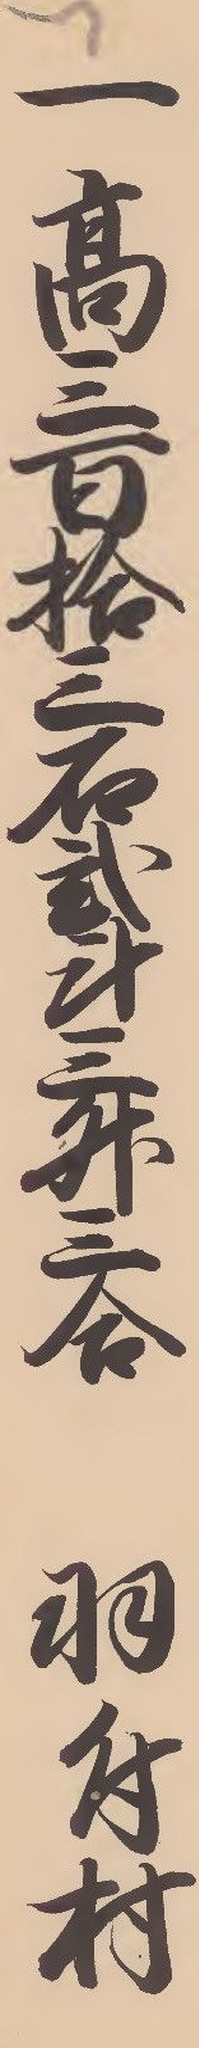一高三百拾三石弐斗三升三合羽付村

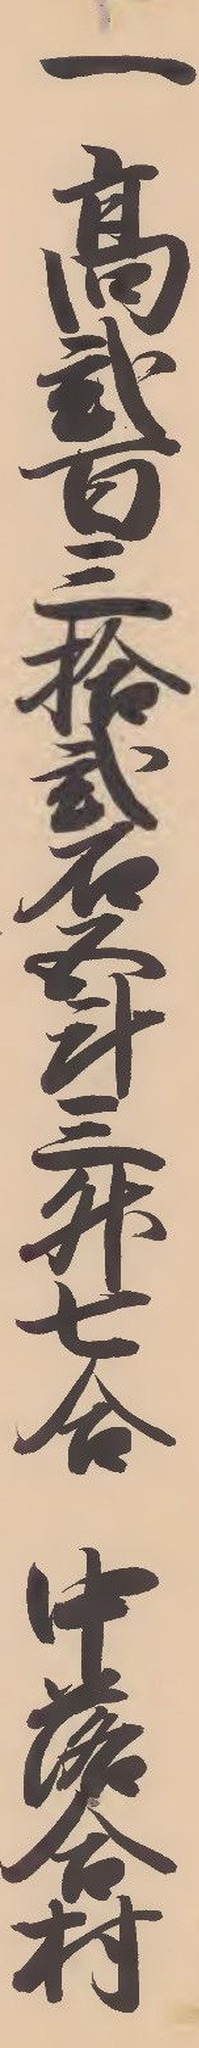一高弐百三拾弐石五斗三升七合中落合村
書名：出羽国郷帳　１
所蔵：国立公文書館 National Archives of Japan
